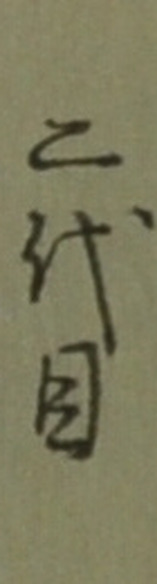二代目
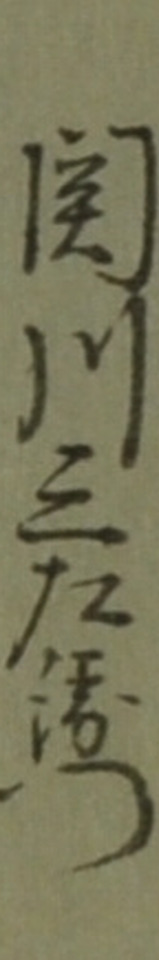関川三左衛門
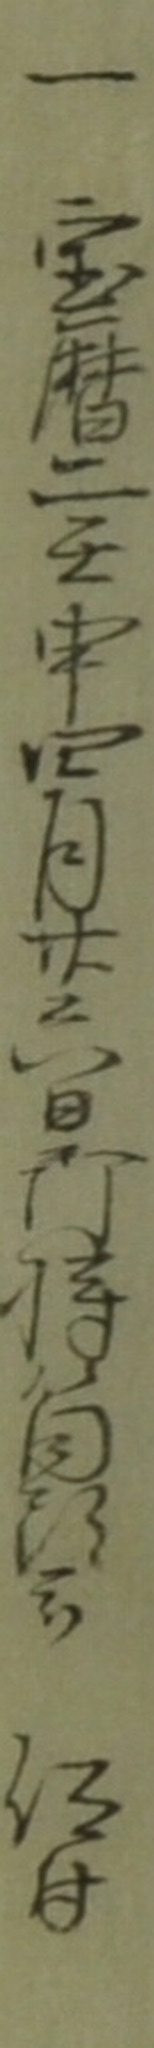一宝暦二壬申四月廿六日御持筒頭被仰付
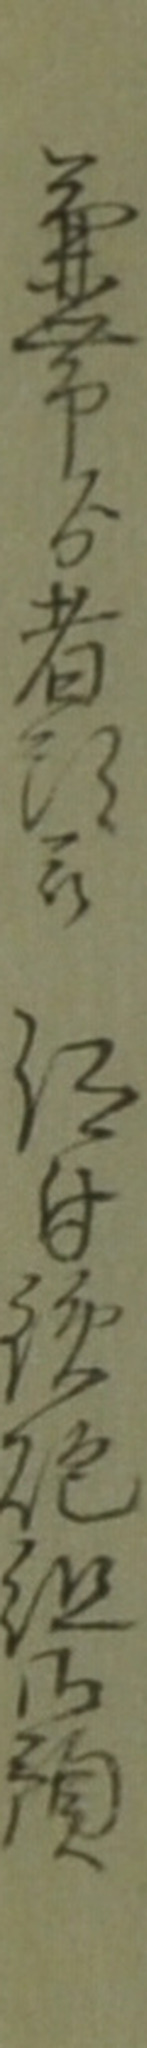兼帯ゟ者頭被仰付鉄砲組御預

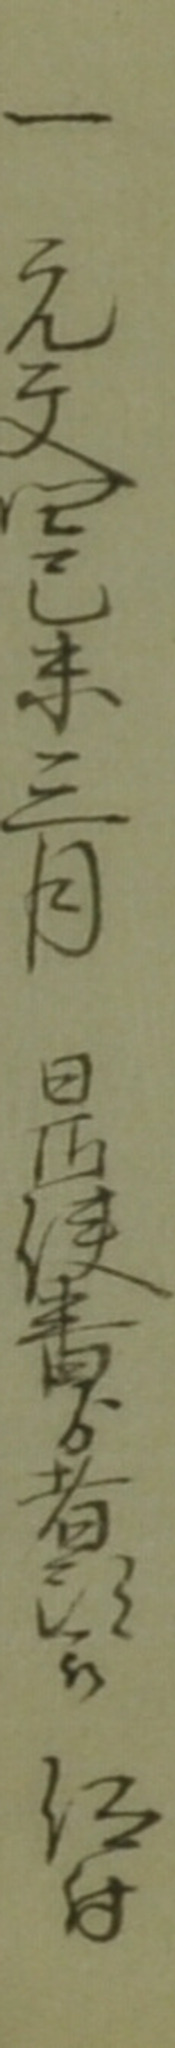一元文四己未三月日御使番ゟ者頭被仰付
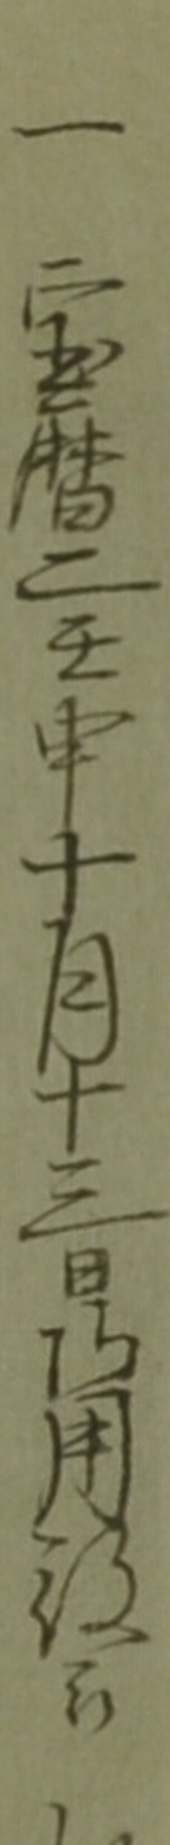一宝暦二壬申十月十三日御用役被仰付
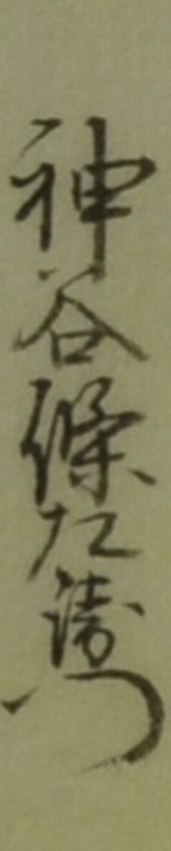神谷條左衛門
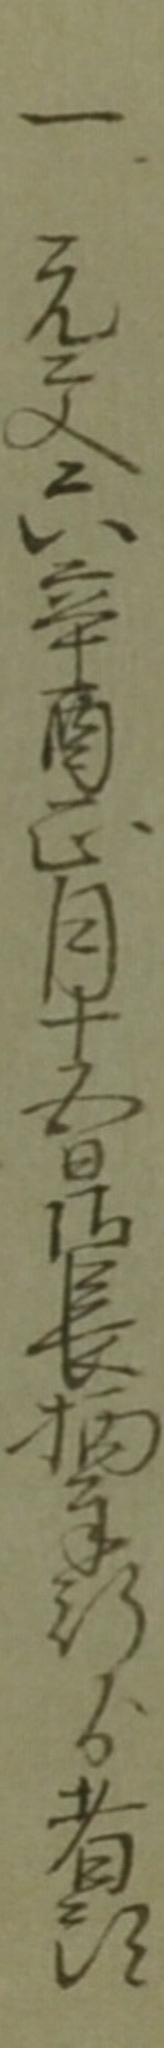一元文六辛酉正月十五日御長柄奉行ゟ者頭
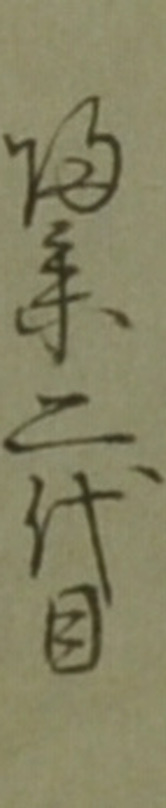帰参二代目
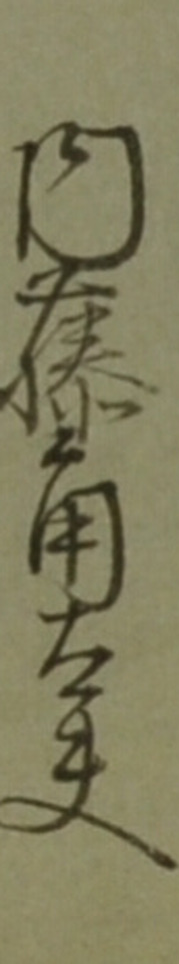内藤角太夫
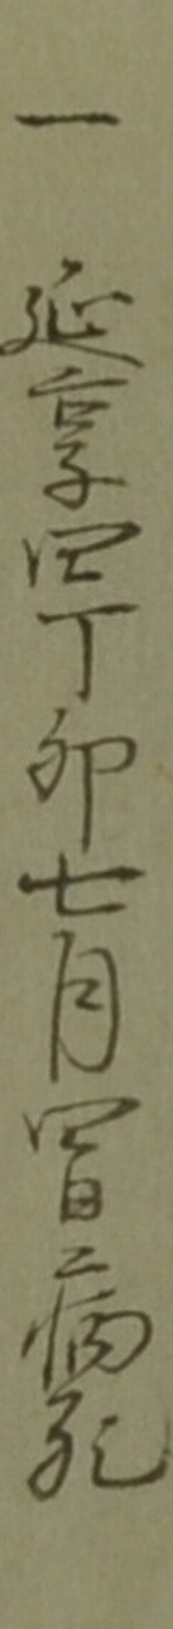一延享四丁卯七月四日病死
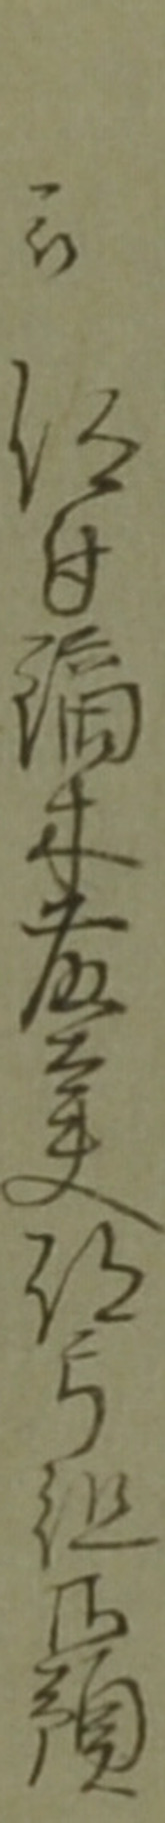被仰付鏑木藤太夫跡弓組御預
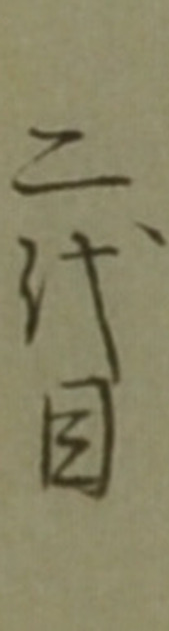二代目
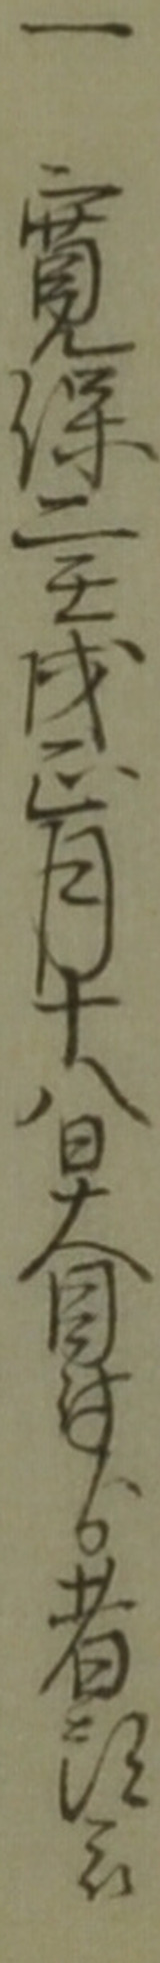一寛保二壬戌正月十八日大目付ゟ者頭被
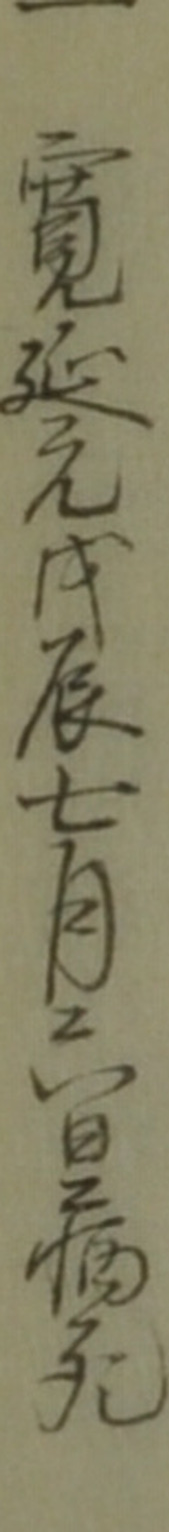一寛延元戊辰七月六日病死
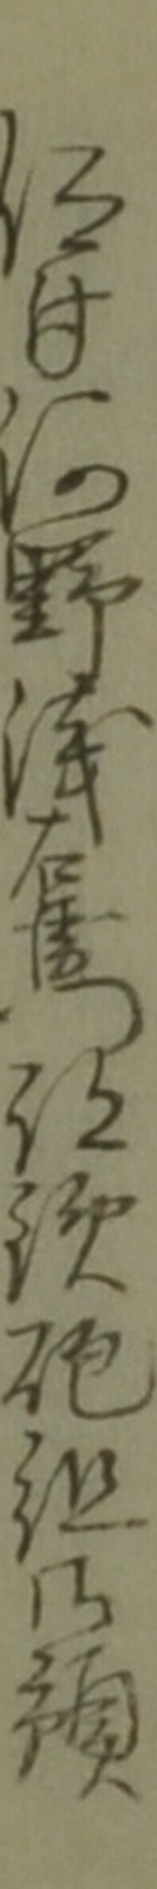仰付河野儀右衛門跡鉄砲組御預
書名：諸御役代々録（二）
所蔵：伊那市立高遠町図書館・合同会社AMANE
